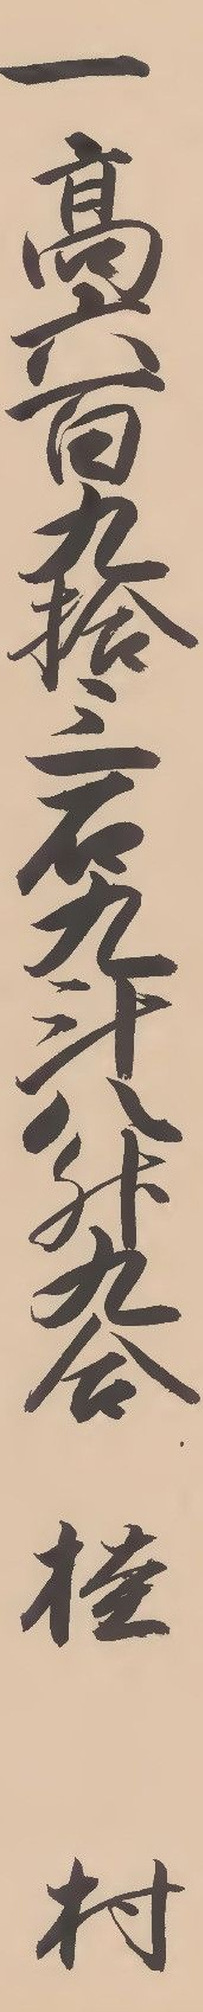一高六百九拾三石九斗八升九合桂村
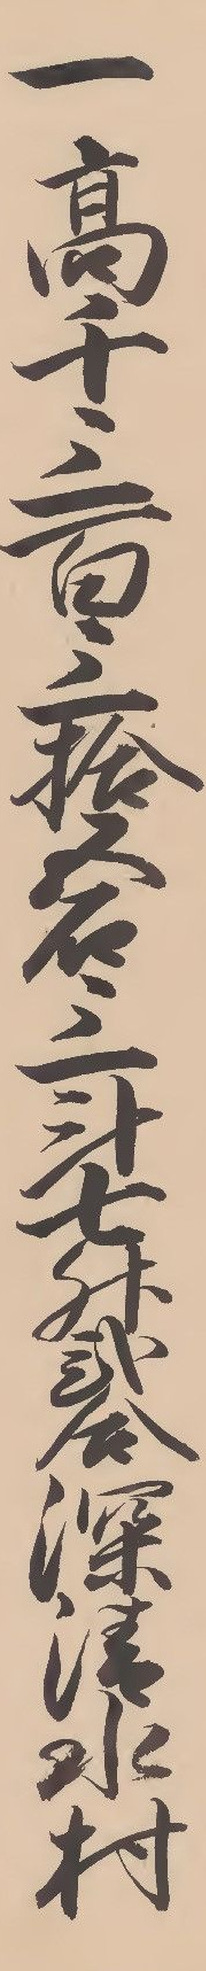一高千三百三拾五石三斗七升弐合深清水村
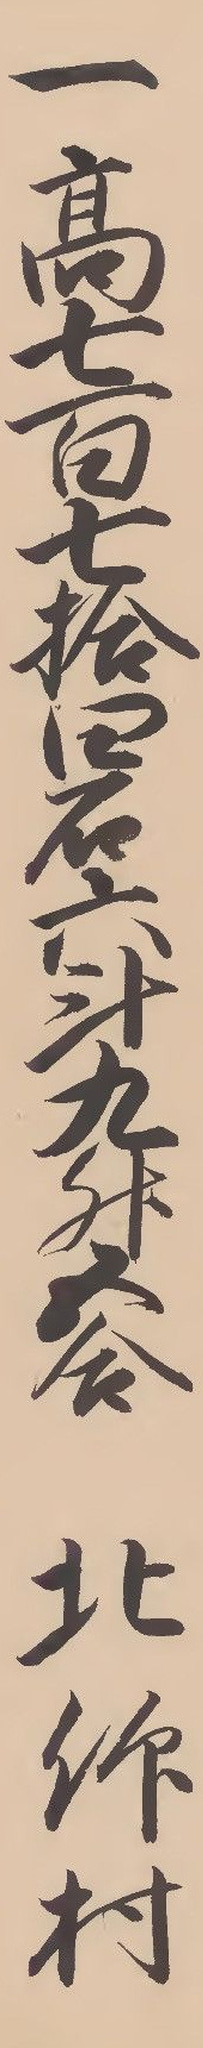一高七百七拾四石六斗九升五合北仰村

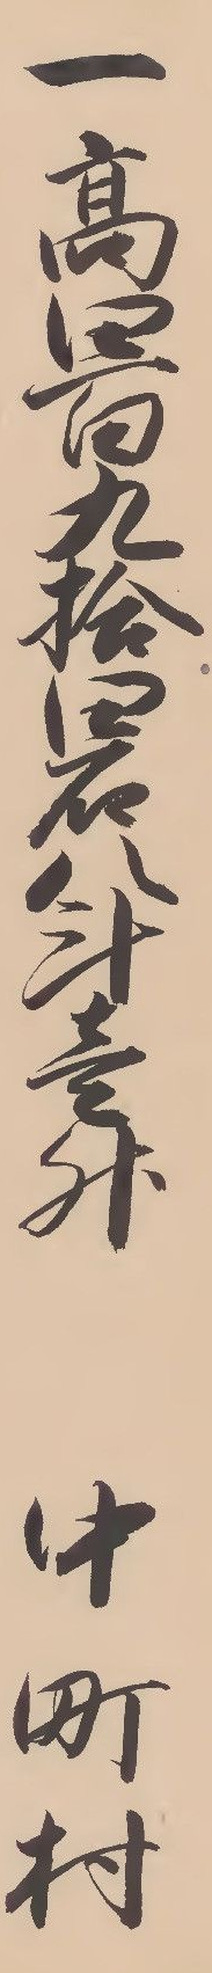一高四百九拾四石八斗壱升中町村
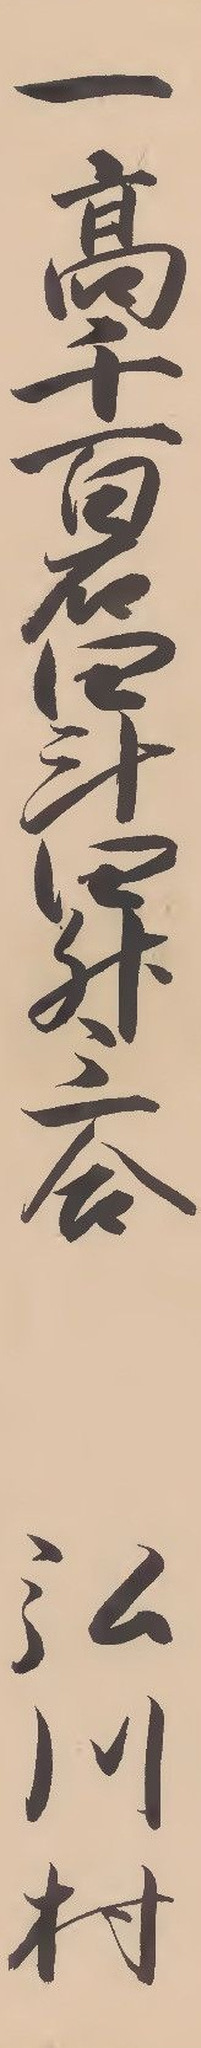一高千百石四斗四升三合弘川村
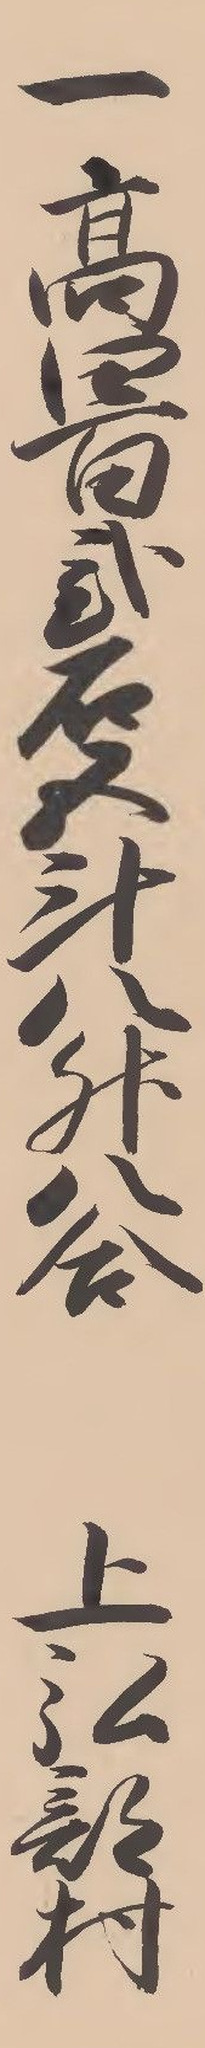一高四百弐石五斗八升八合上弘部村
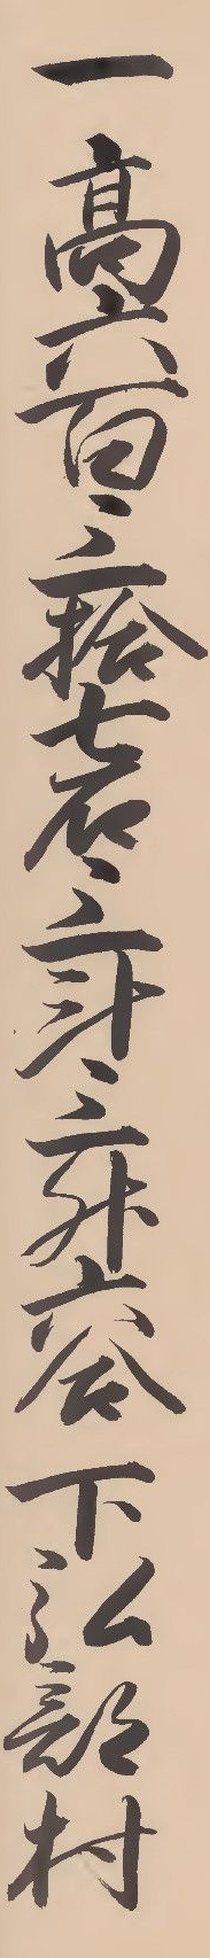一高六百三拾七石三斗三升六合下弘部村
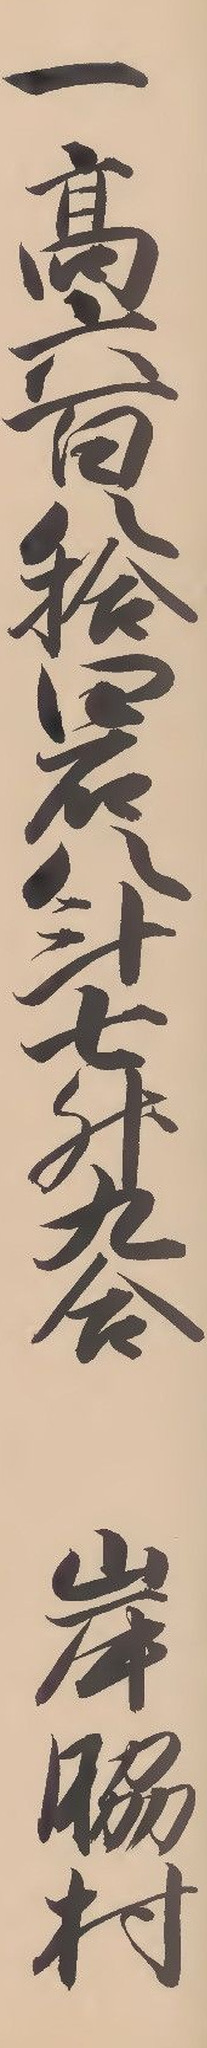一高六百八拾四石八斗七升九合岸脇村
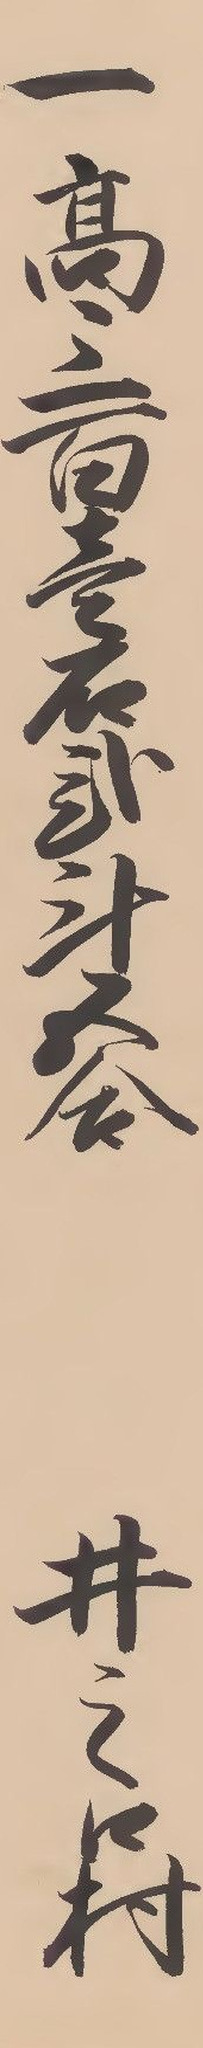一高三百壱石弐斗五合井之口村
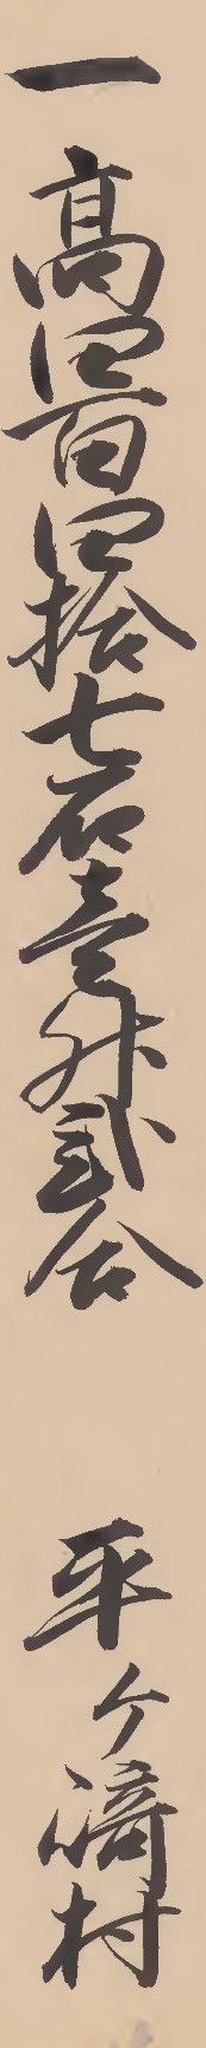一高四百四拾七石壱升弐合平ヶ崎村

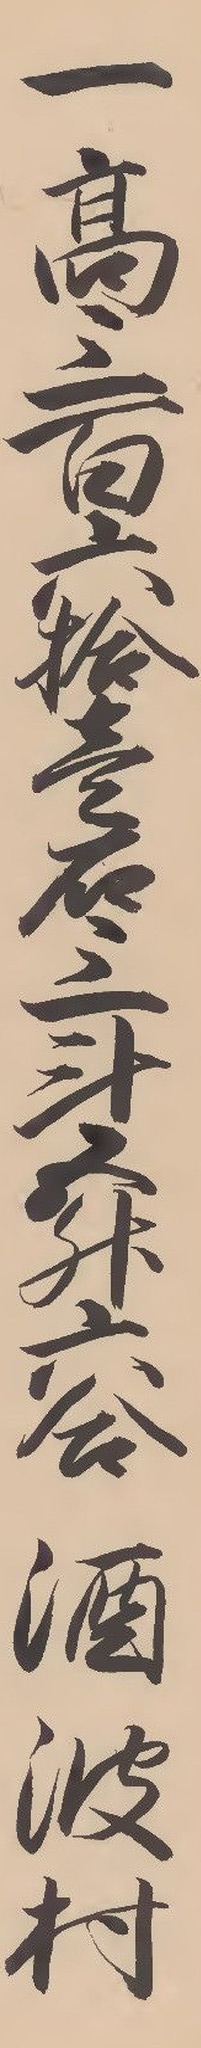一高三百六拾壱石三斗五升六合酒波村
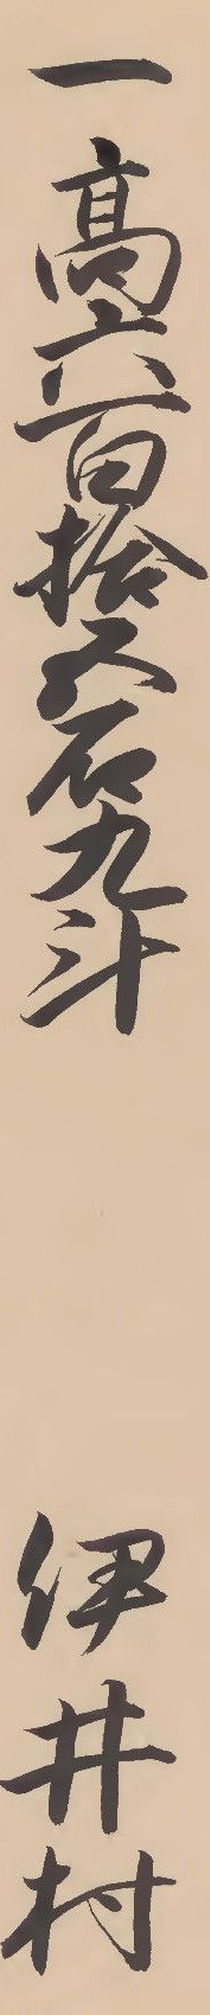一高六百拾五石九斗伊井村
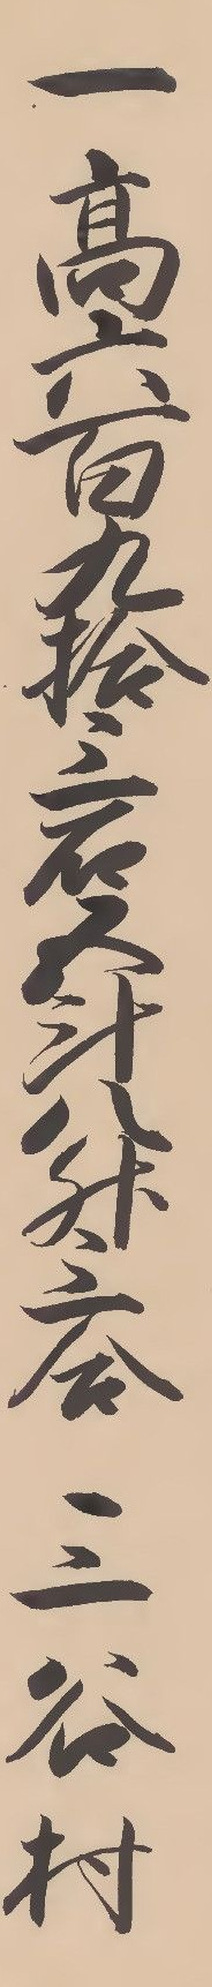一高六百九拾三石五斗八升三合三谷村
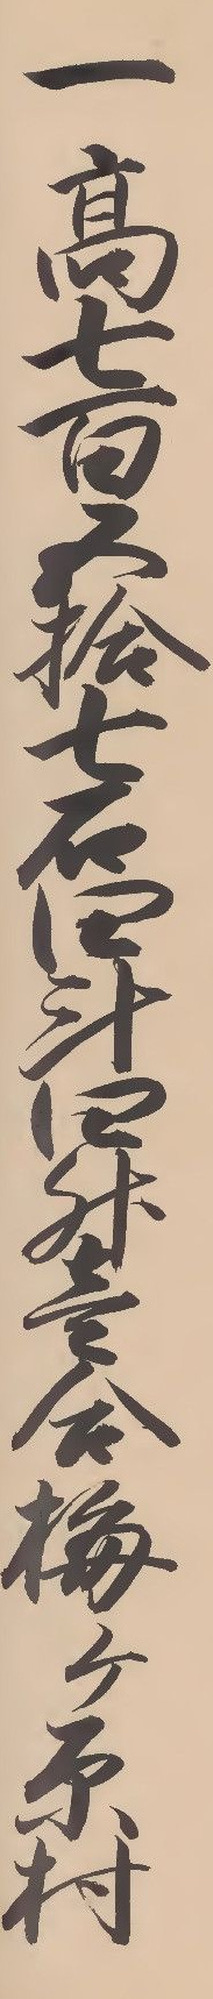一高七百五拾七石四斗四升壱合梅ケ原村
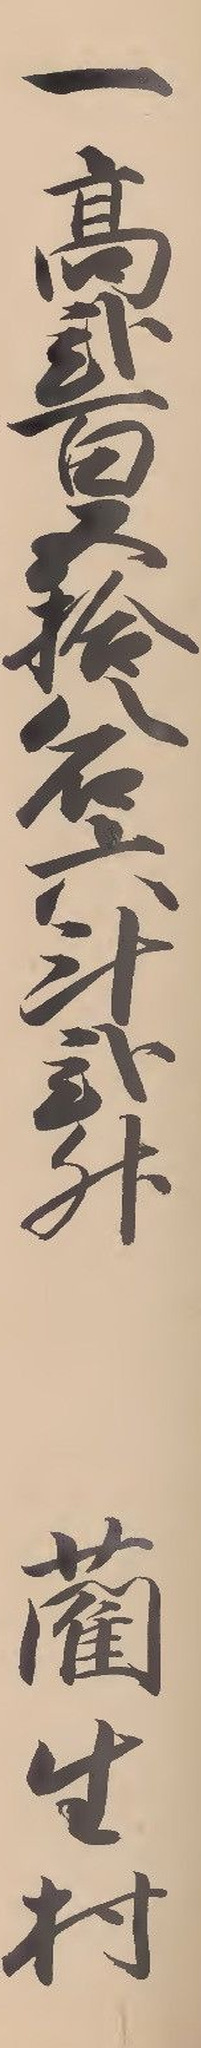一高弐百五拾八石六斗弐升藺生村
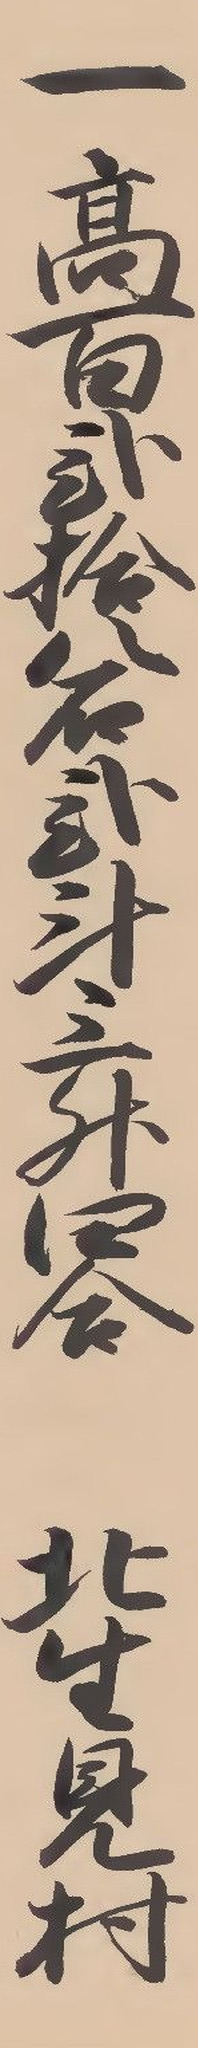一高百弐拾八石弐斗三升四合北生見村
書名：近江国郷帳
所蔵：国立公文書館 National Archives of Japan
